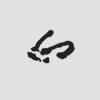㠯（以）
